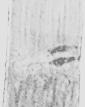二
